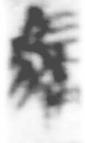○（服）
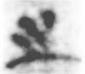之
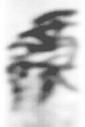鄭
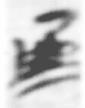爲
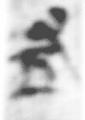○（右）
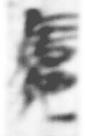驂
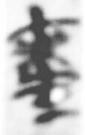𨍱（乘）
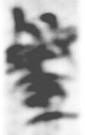○（畋）
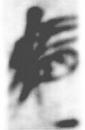駟
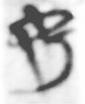𡚦
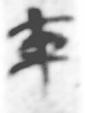車
